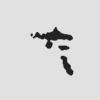備
